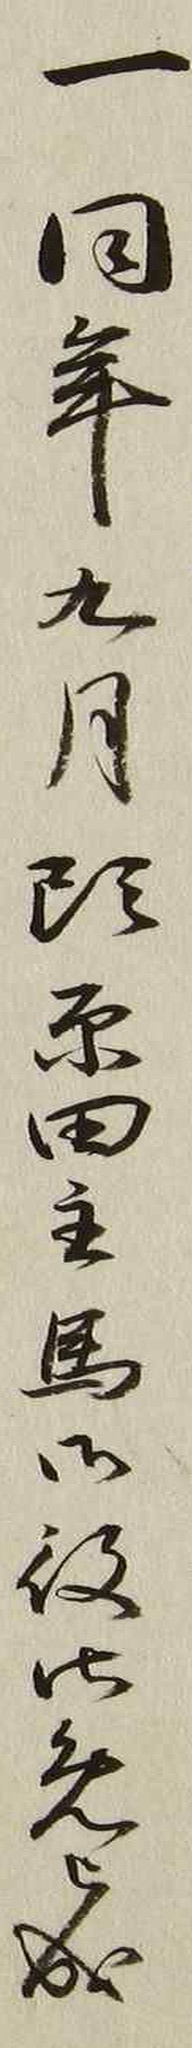一同年九月頭原田主馬御役御免被成
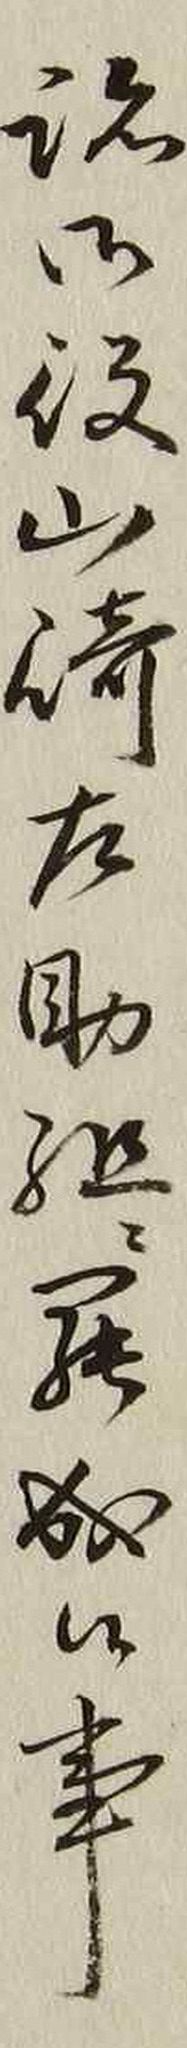跡御役山崎左助組ニ罷成候事
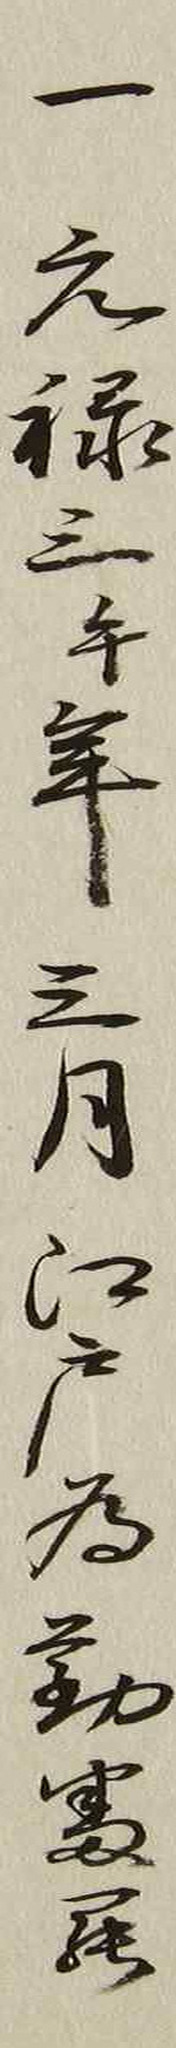一元禄三午年三月江戸為勤番罷
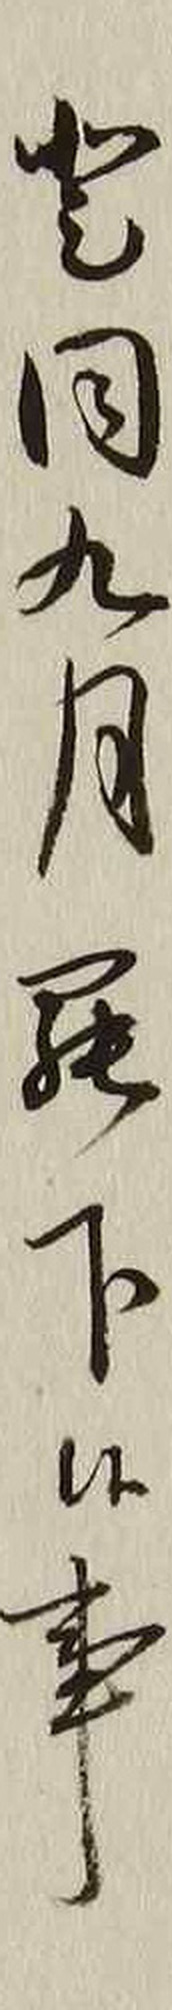登同九月罷下候事
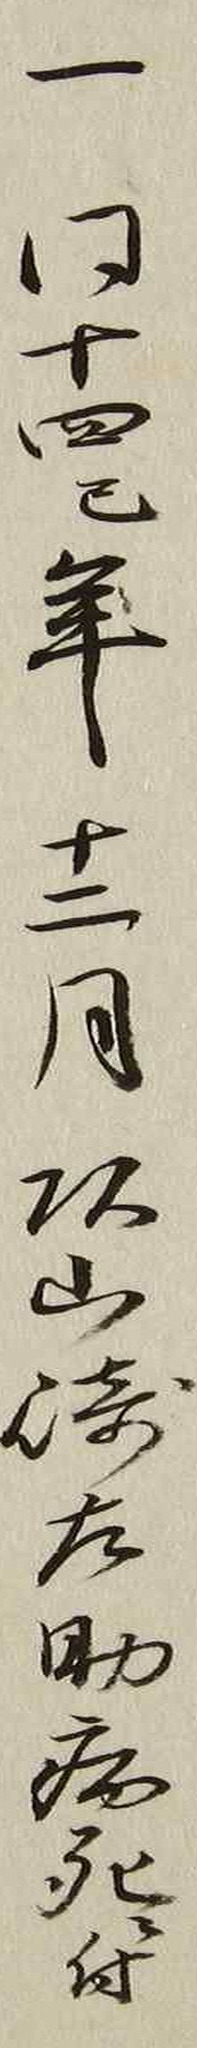一同十四巳年十二月頭山崎左助病死ニ付
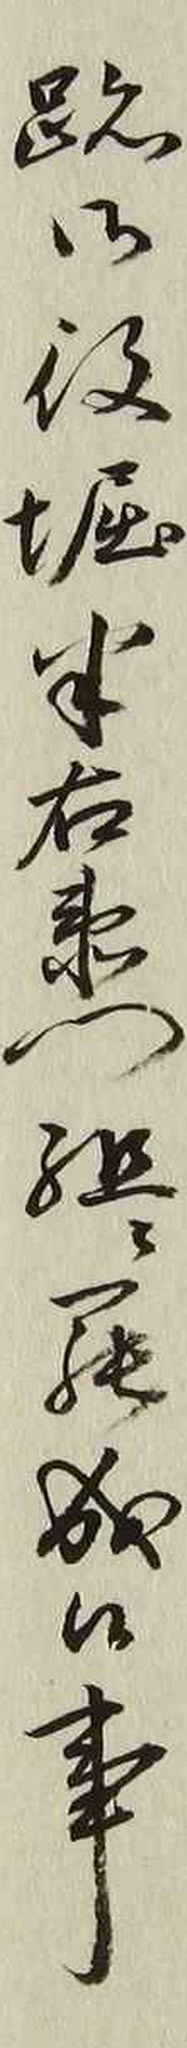跡御役堀半右衛門組ニ罷成候事
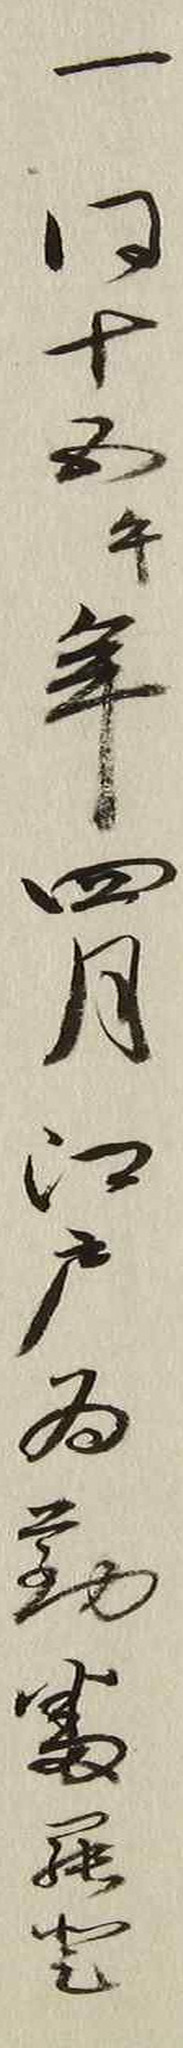一同十五午年四月江戸為勤番罷登
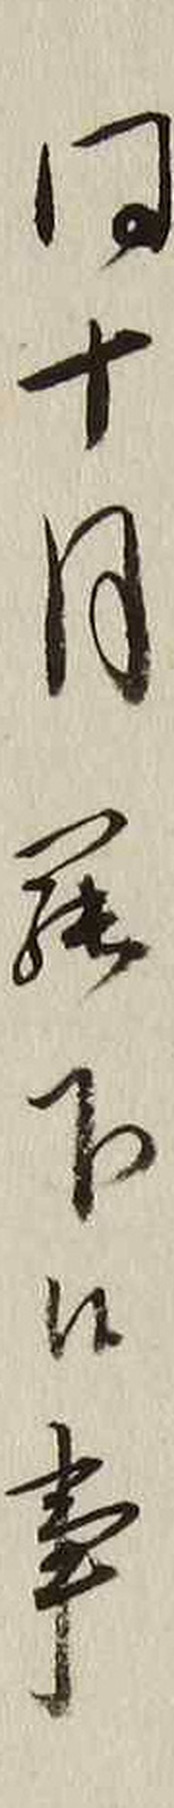同十月罷下候事
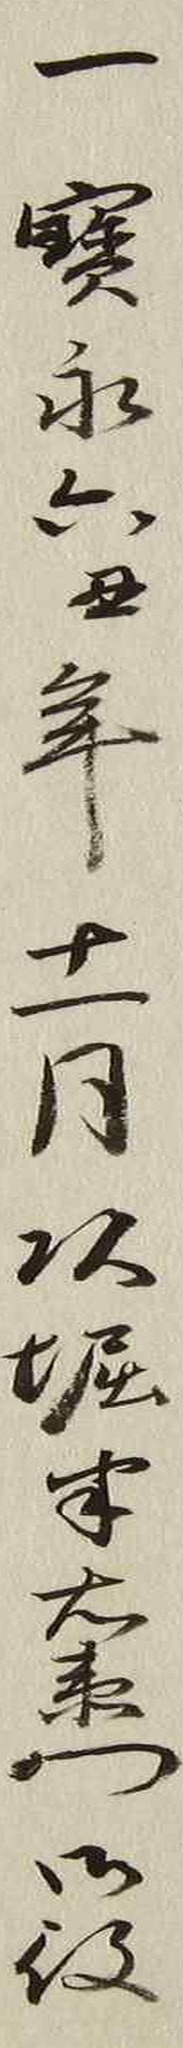一宝永六丑年十一月頭堀半右衛門御役
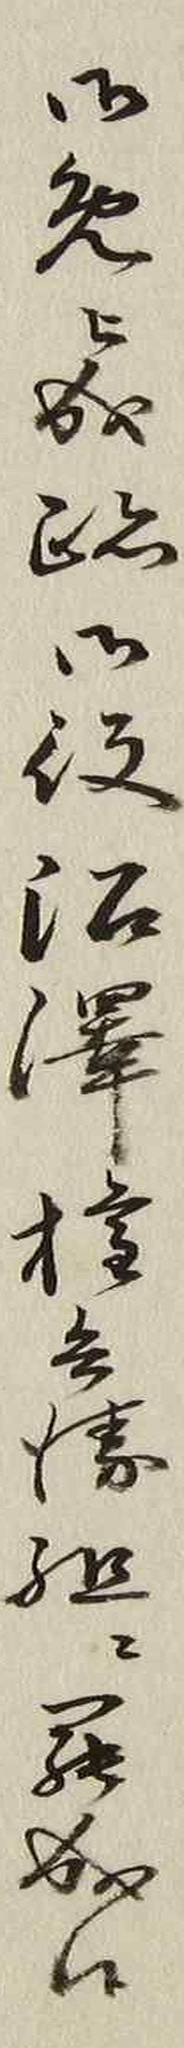御免被成跡御役沼沢権兵衛組ニ罷成候
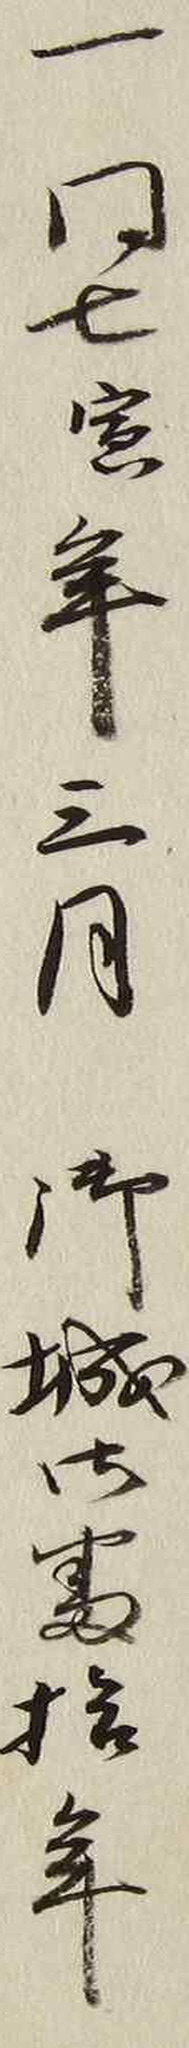一同七寅年三月御城御番拾年
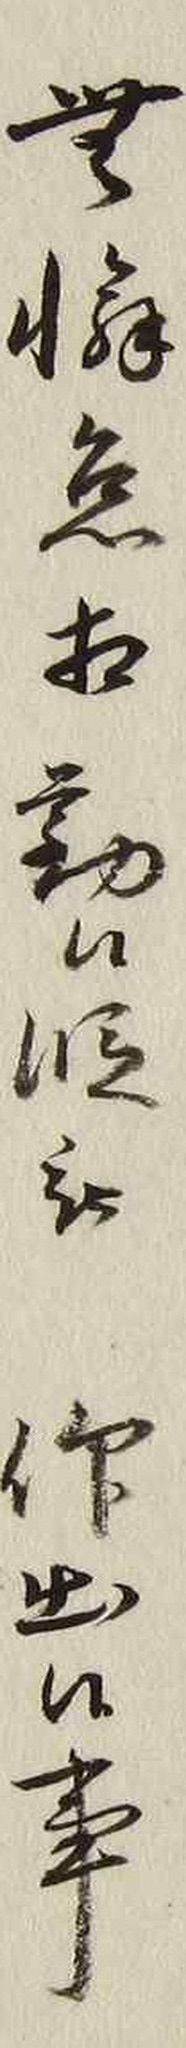無懈怠相勤候段被仰出候事
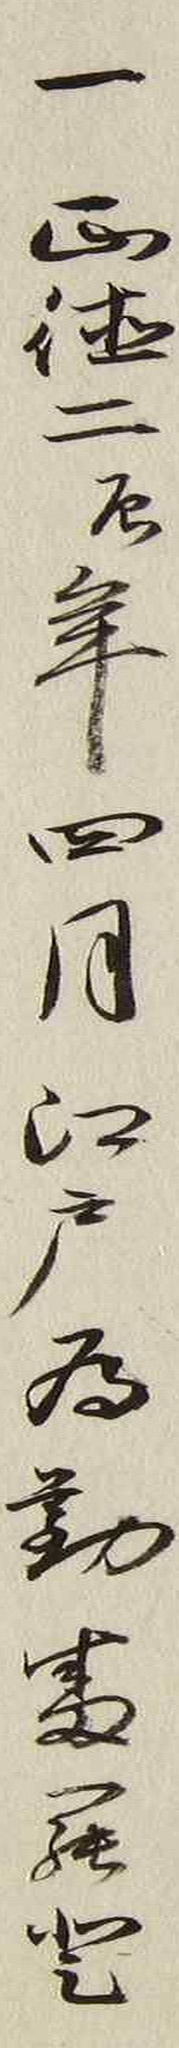一正徳二辰年四月江戸為勤番罷登
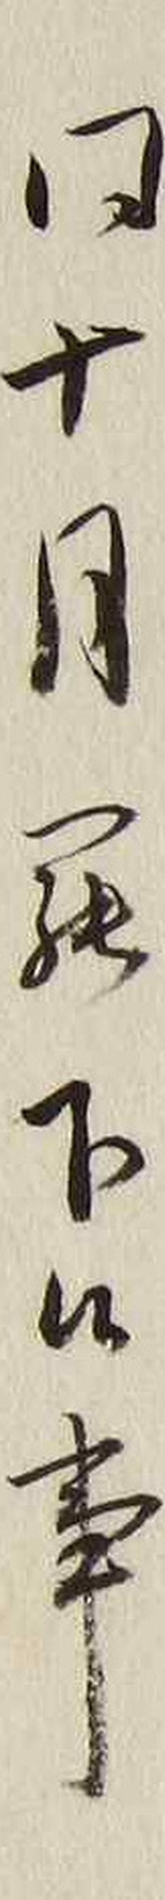同十月罷下候事
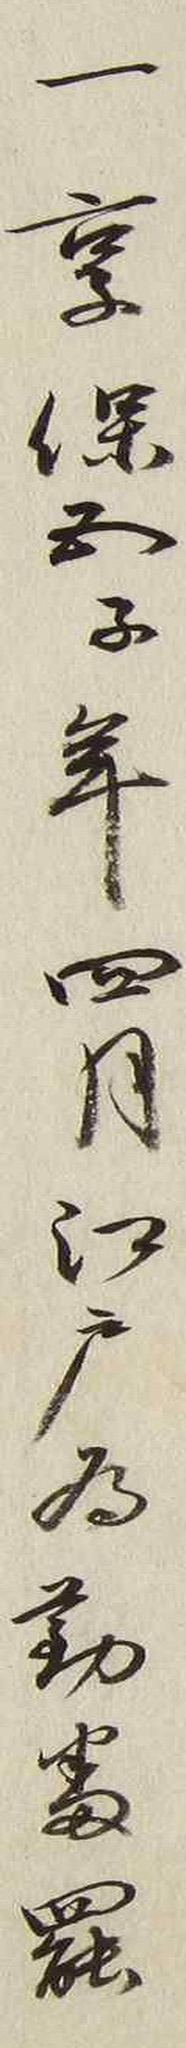一享保五子年四月江戸為勤番罷

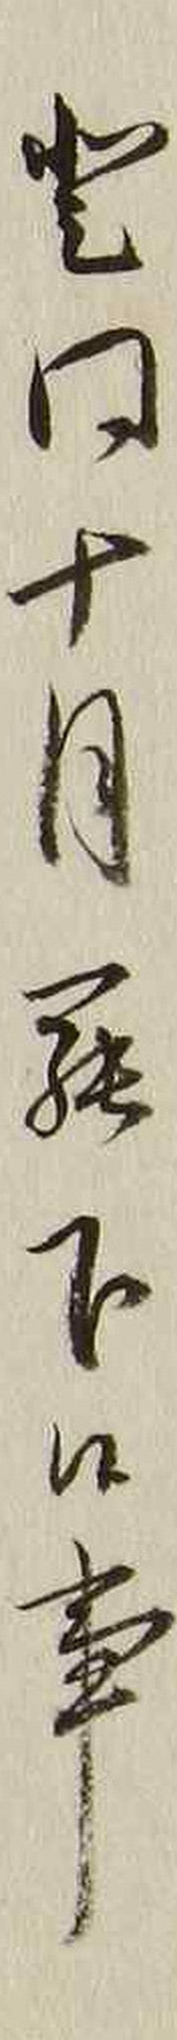登同十月罷下候事
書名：諸士系譜　巻之160　な之部2
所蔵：会津若松市立会津図書館
